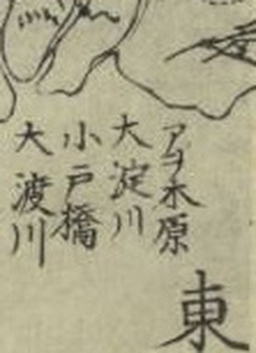大渡川
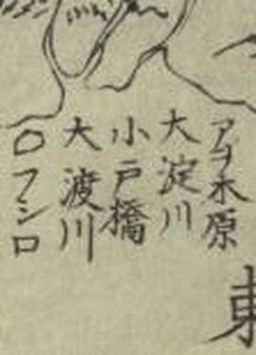小戸橋
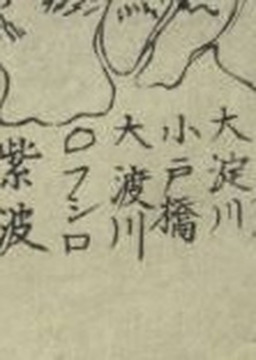大渡川

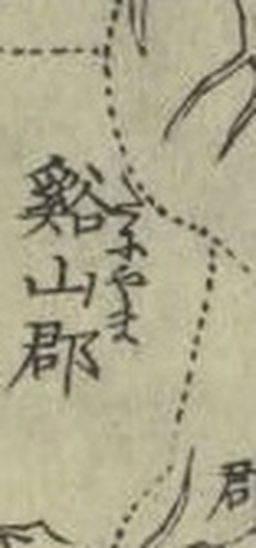谿山郡
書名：大日本分境図成
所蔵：University of the Ryukyus Library
